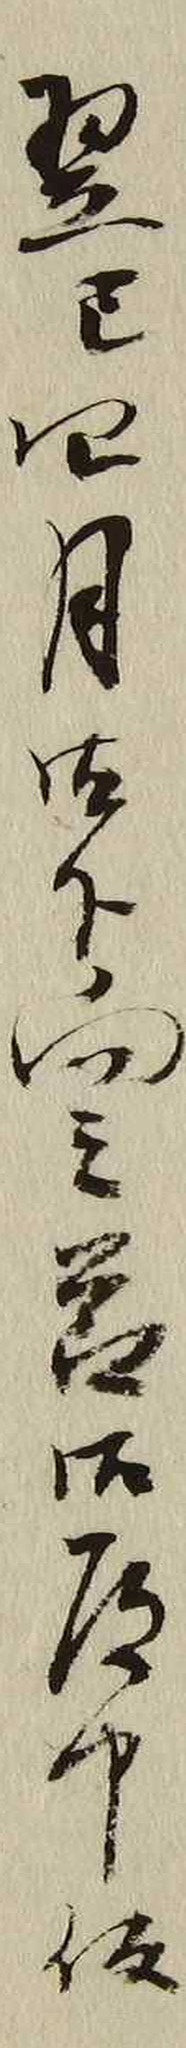翌巳四月御下向之節御道中仮
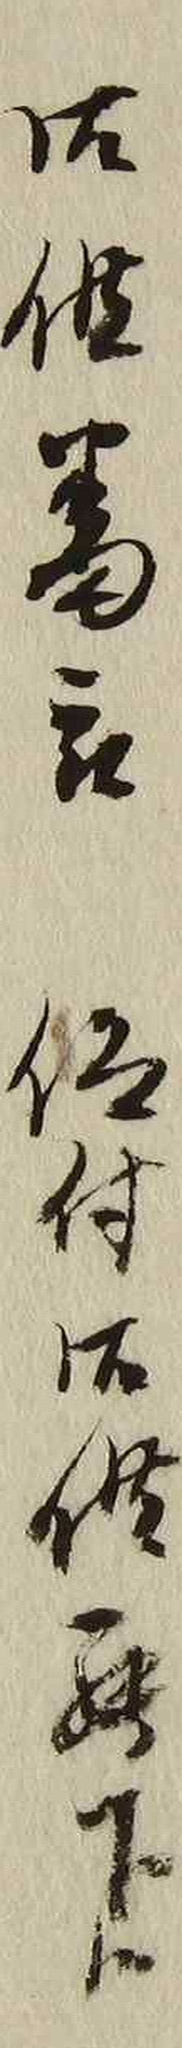御供番被仰付御供罷下候
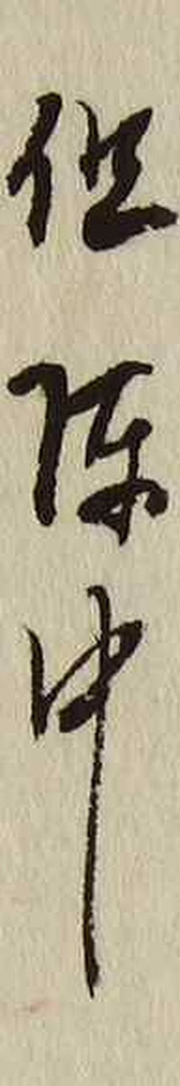但陣中
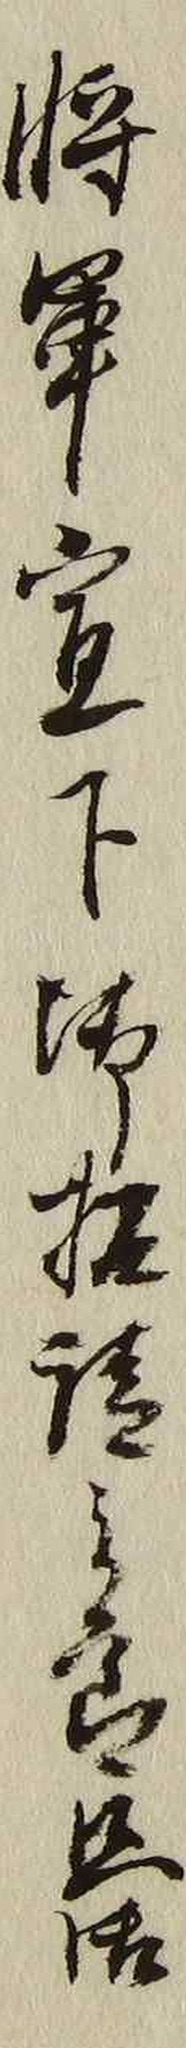将軍宣下御招請之節且御
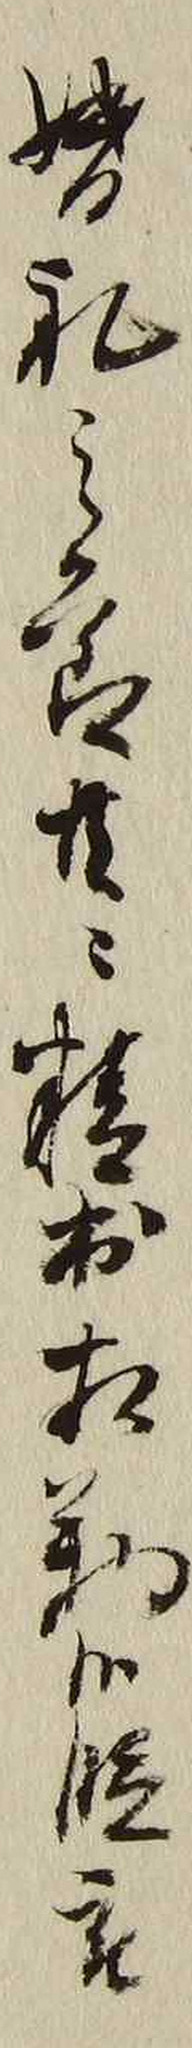婚礼之節共ニ精出相勤候段被
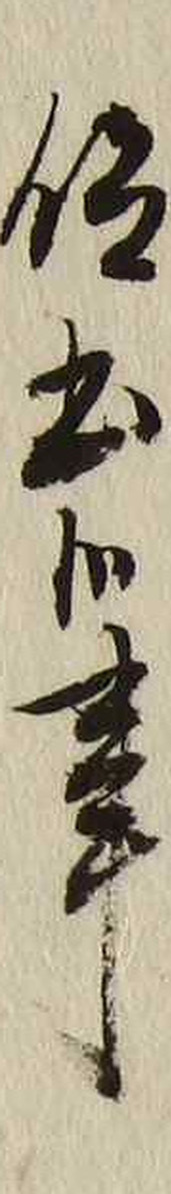仰出候事
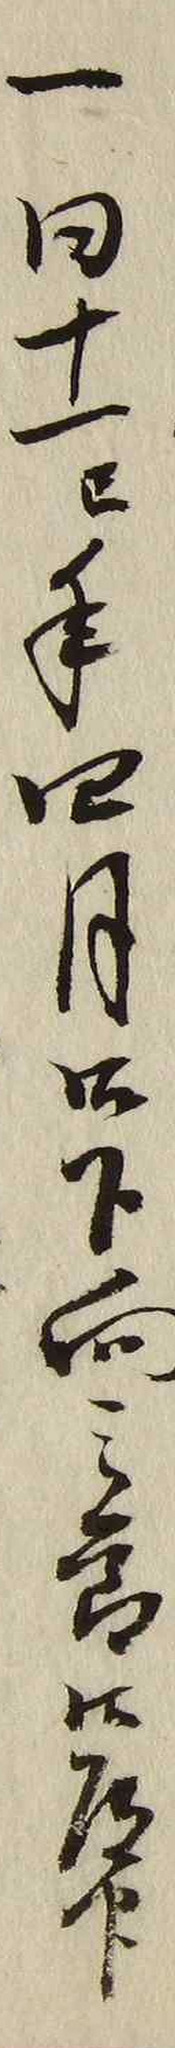一同十一巳年四月御下向之節御道中
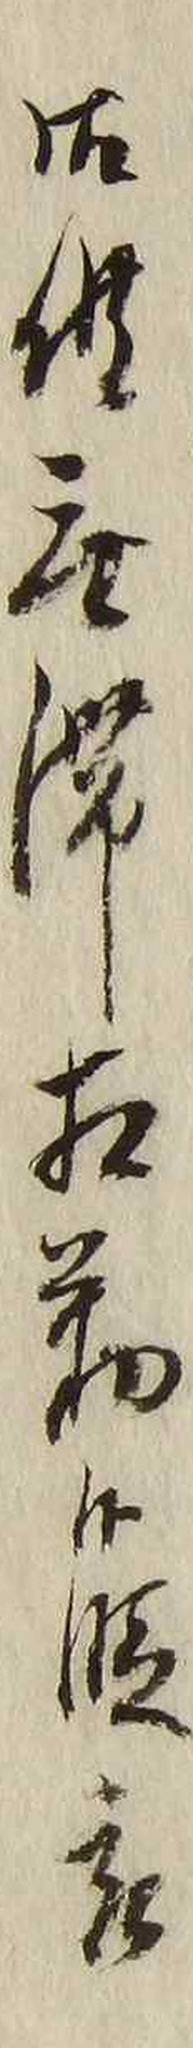御供無滞相勤候段被

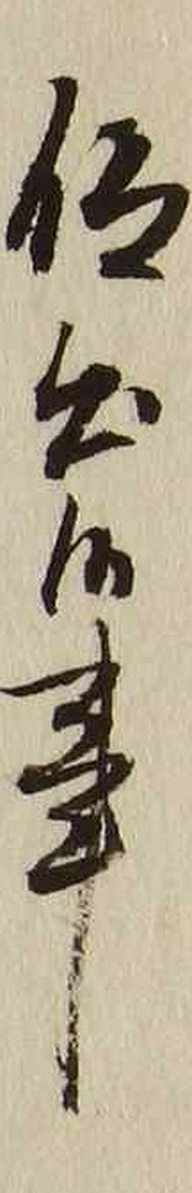仰出候事
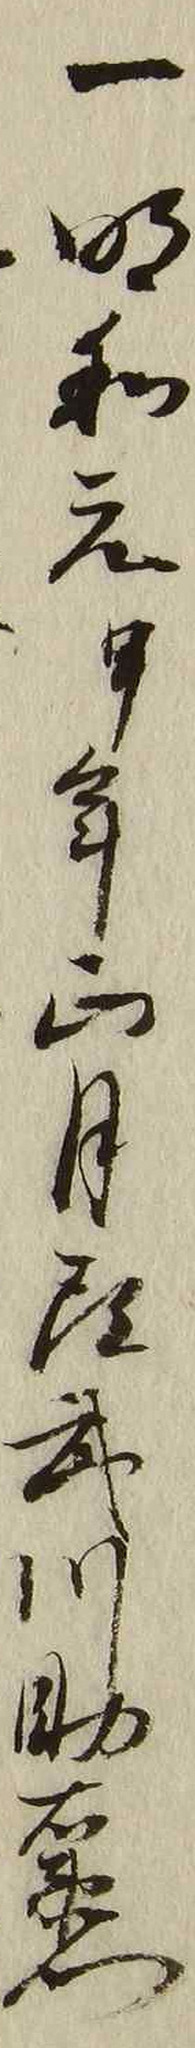一明和元申年正月頭武川助右衛門
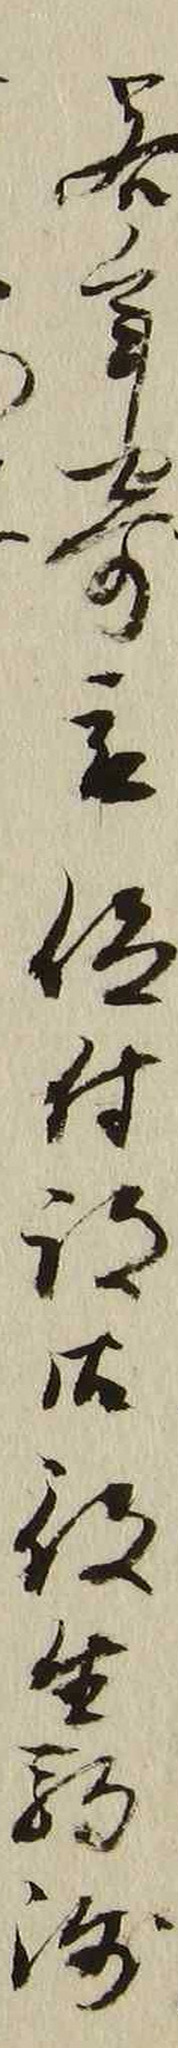若年寄被仰付跡御役生駒浅
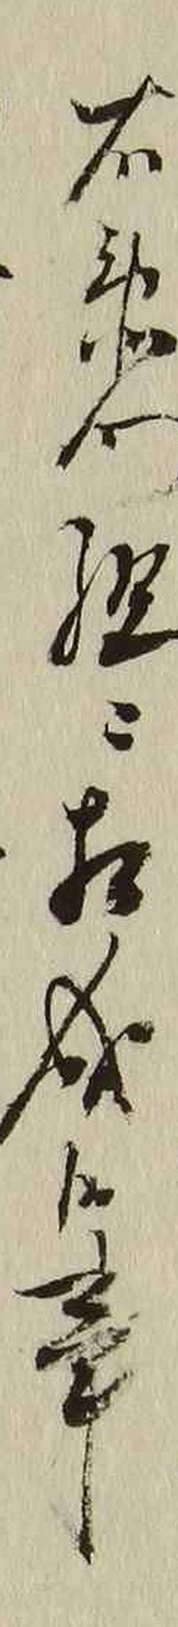右衛門組ニ相成候事
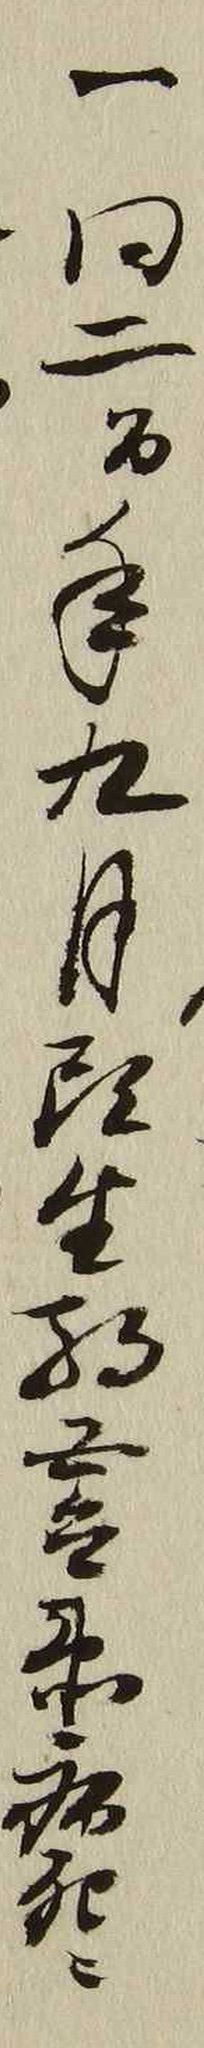一同二酉年九月頭生駒五兵衛病死ニ
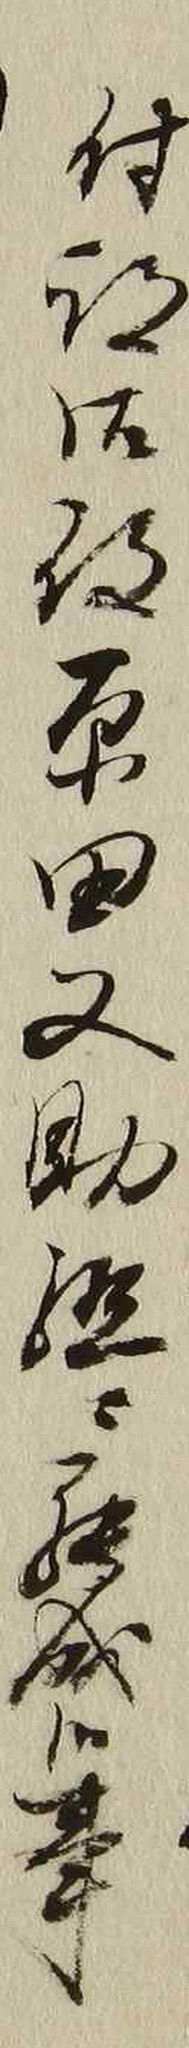付跡御役原田又助組ニ罷成候事
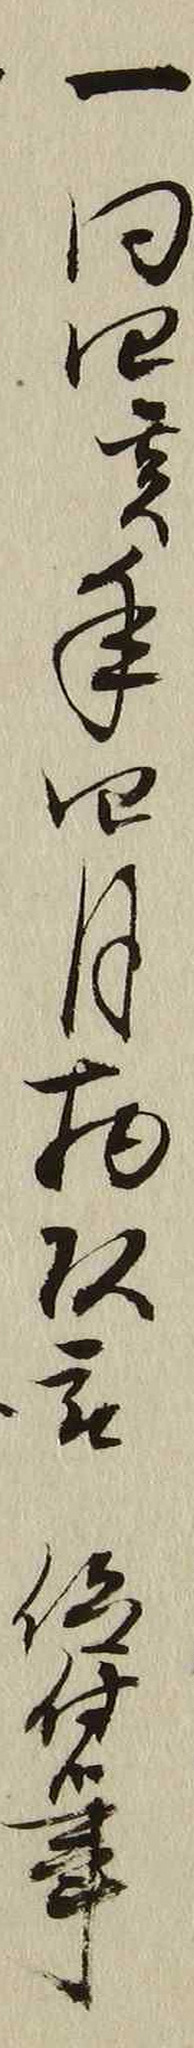一同四亥年四月物頭被仰付候事
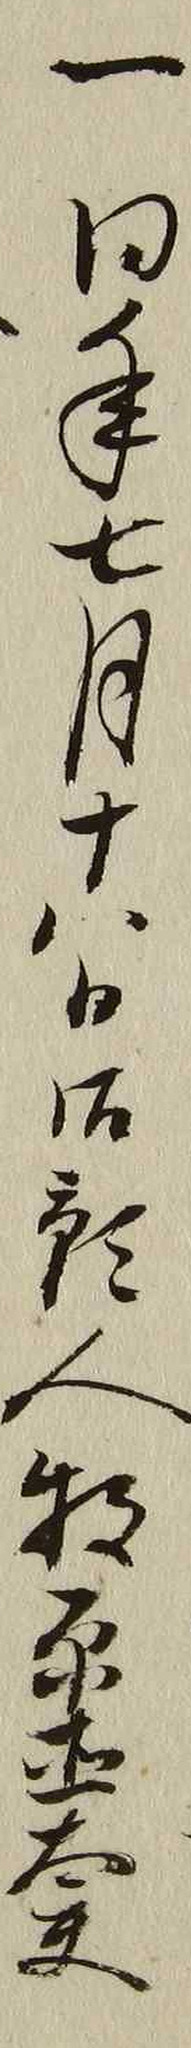一同年七月十八日御預人牧原直太夫
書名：諸士系譜　巻之349　も之部5
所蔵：会津若松市立会津図書館
